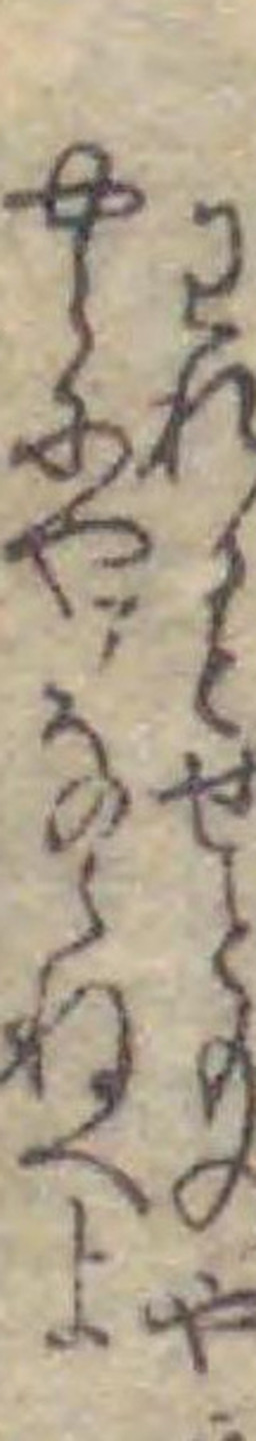やらにやァならねへよ
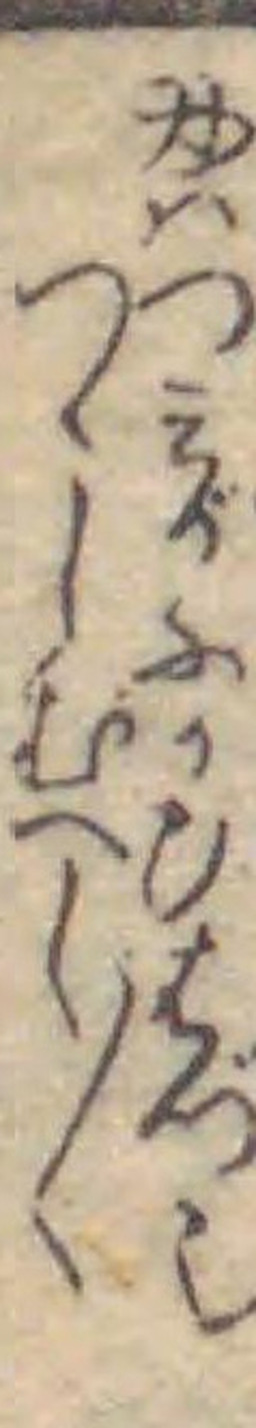つゝしむへし〳〵

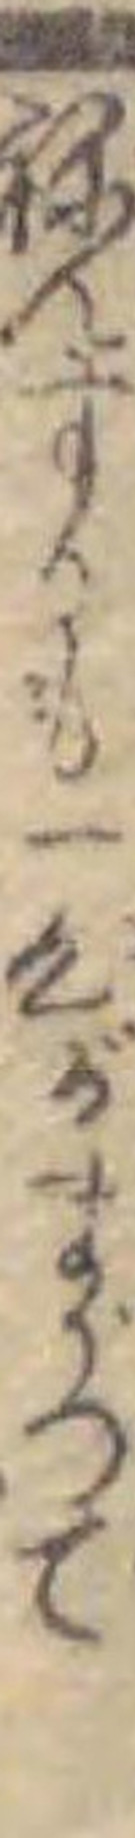ねんするも一心がまがつて
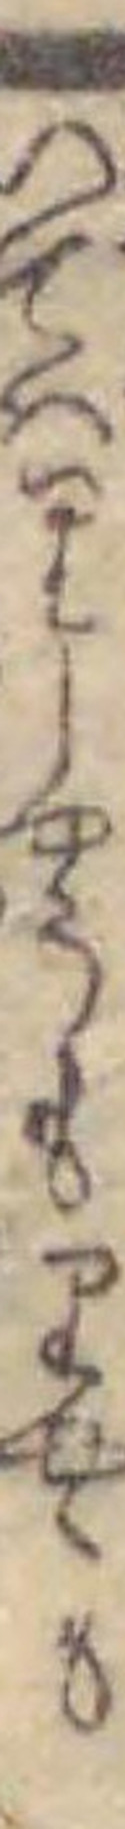いてはりしやうもりやくも
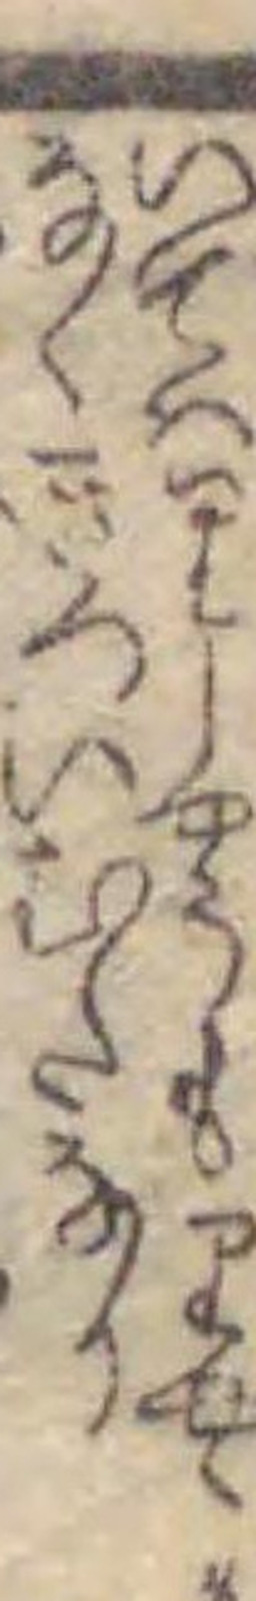なくきついむたなり
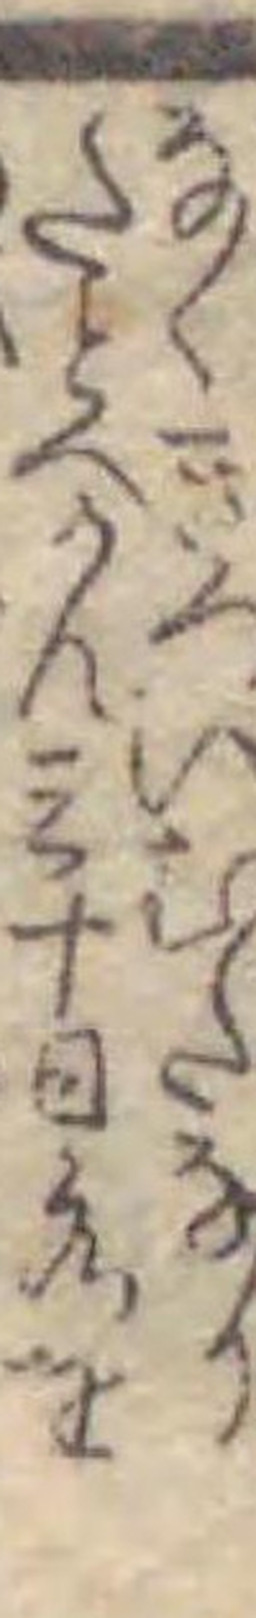たとへかん三十日水を
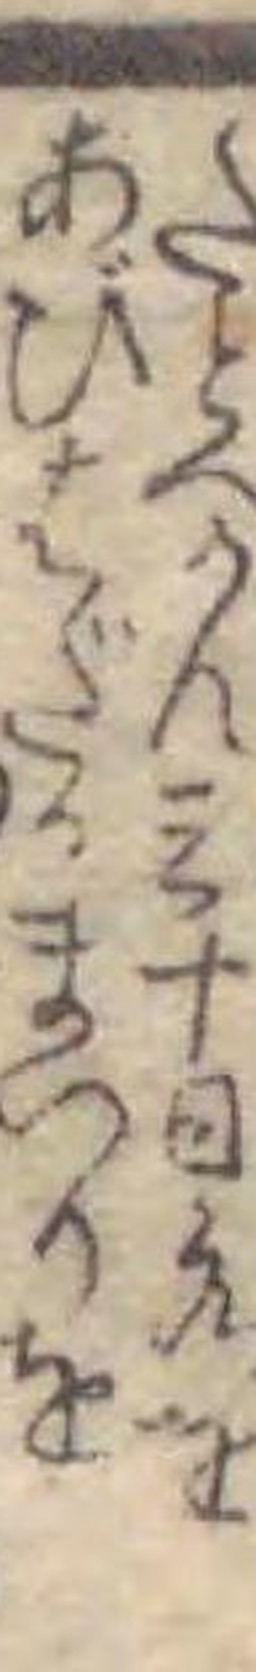あびはだかまいりを
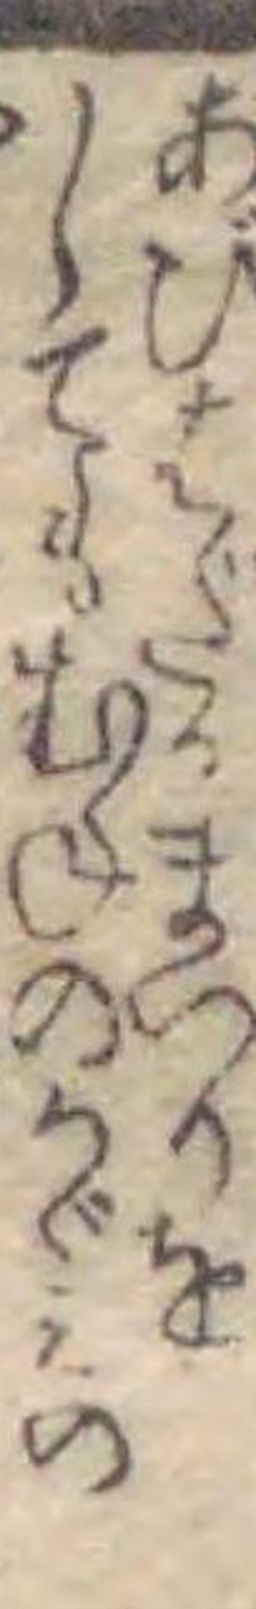してもむねのかゞみの
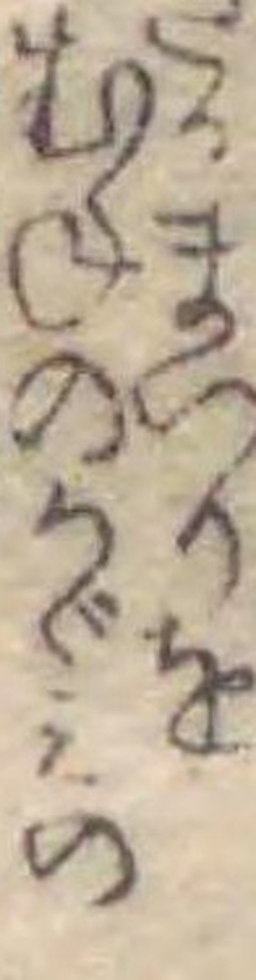むねのかゞみは
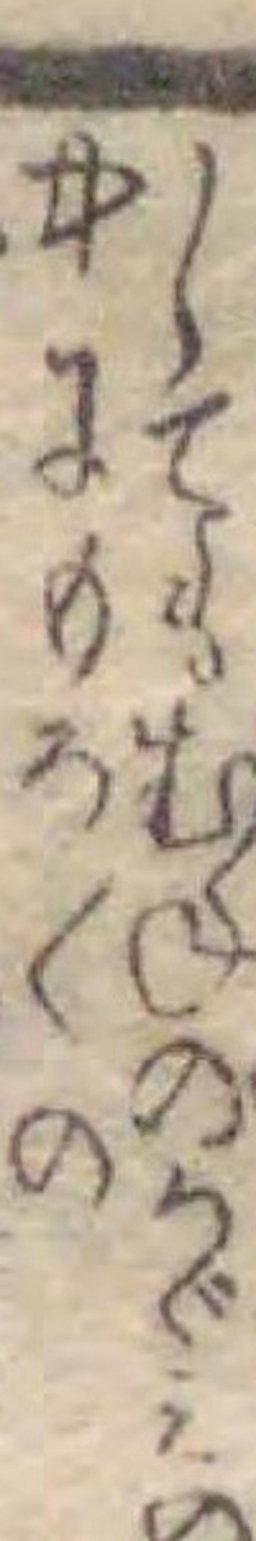中にもろ〳〵の
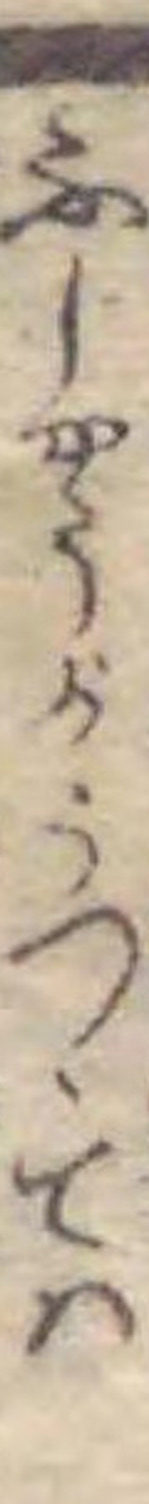ふしやうがうつゝては
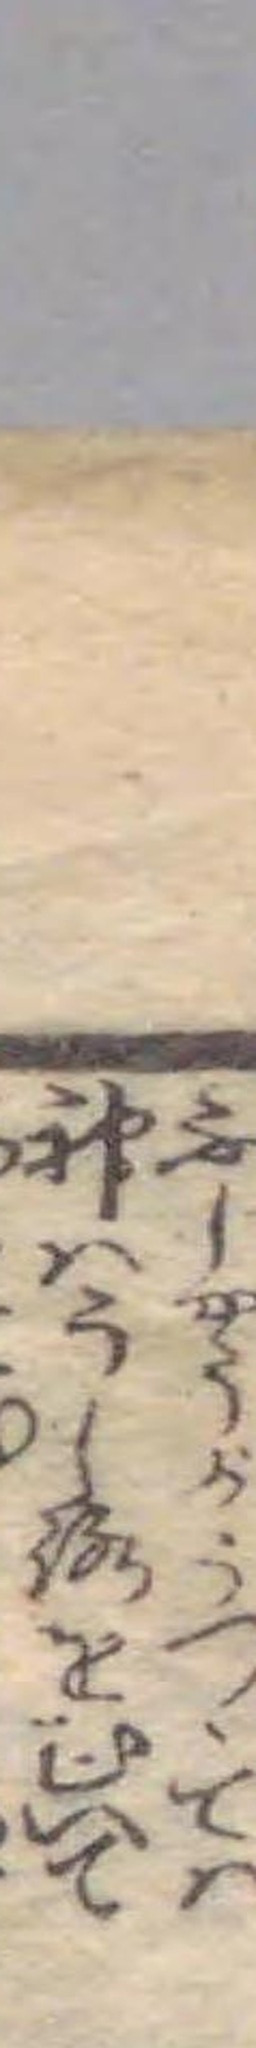神はうしろをむいて
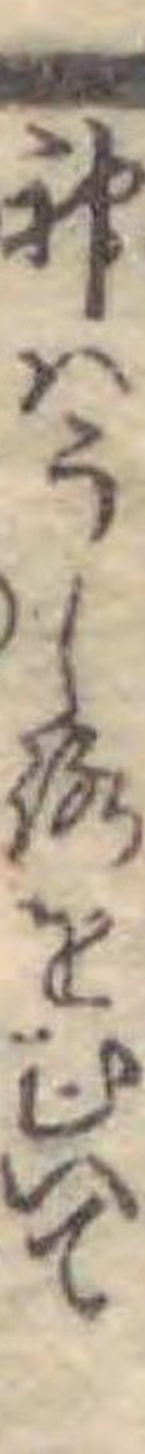神はうしろをむいて
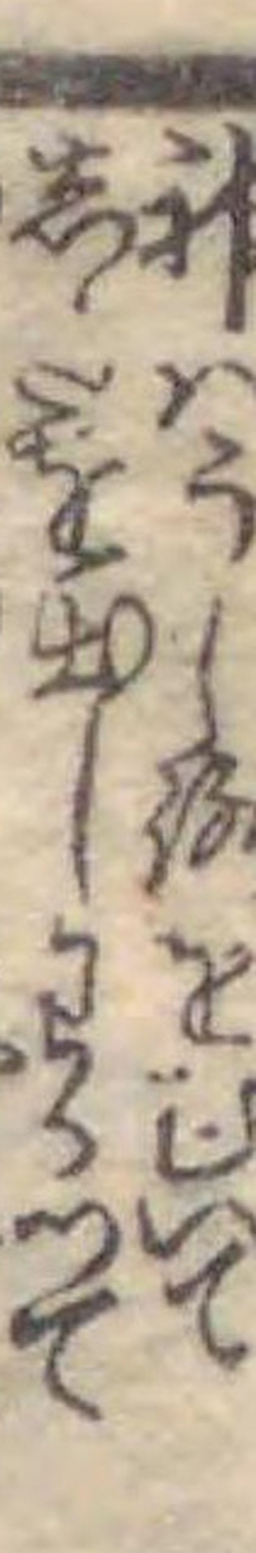したを出しわかつて
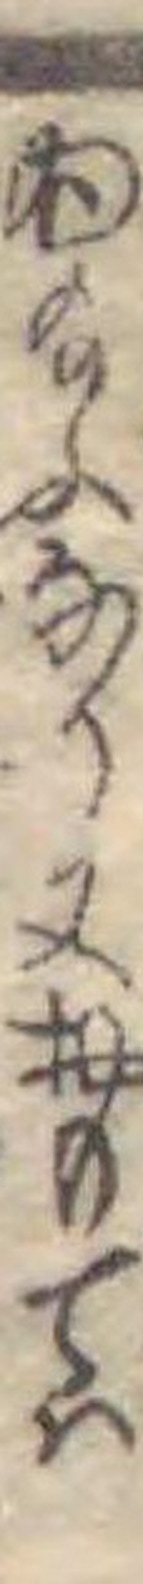ゐ給ふなり又おもては
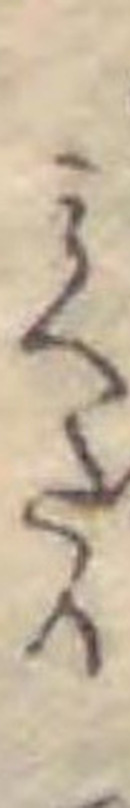みへたり
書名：人心鏡写絵 : 3巻
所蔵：国立国会図書館 National Diet Library, JAPAN
